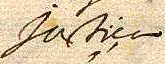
justiça
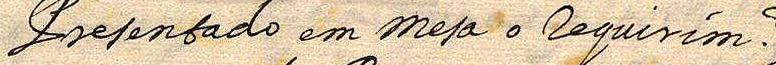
Presentado em mesa o Requirim.to
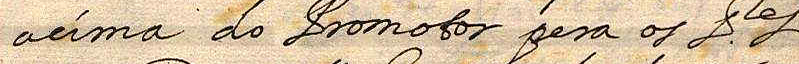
acima do Promotor pera os s.res
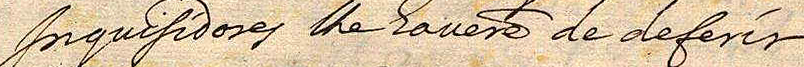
Jnquisidores lhe hauerē de deferir
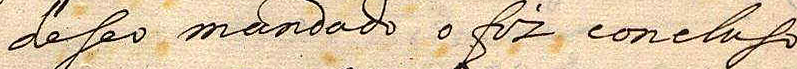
de seo mandado o fiz concluso
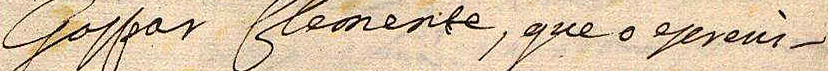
Gaspar Clemente, que o escreui
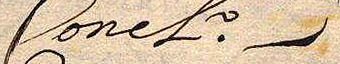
ConcLo.
